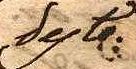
deste.
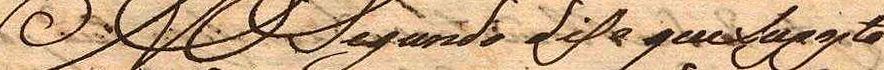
AO Segundo disse que suposto
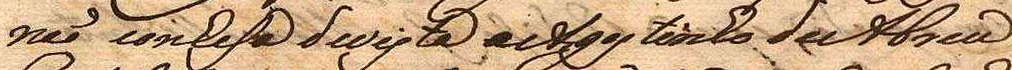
naõ conhesa de vista a Agostinho de Abreu
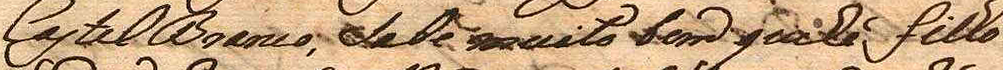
Castel Branco, sabe muito bem que hé filho
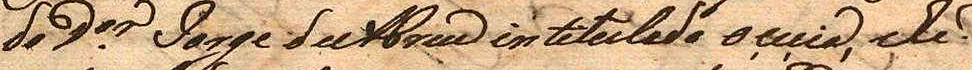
do D.or Iorge de Abreu intitulado o çeçia, e hé!
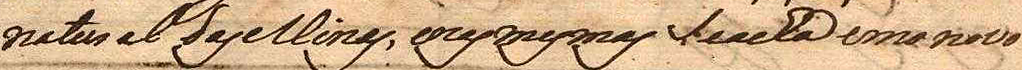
natural das Minas, e nas mesmas se acha em o novo
